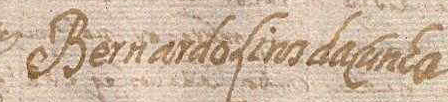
Bernardo Lins da Cunha
